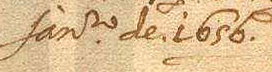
Jan.ro de i656.
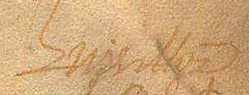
Luis Alvz̄
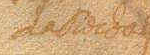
da Rocha
